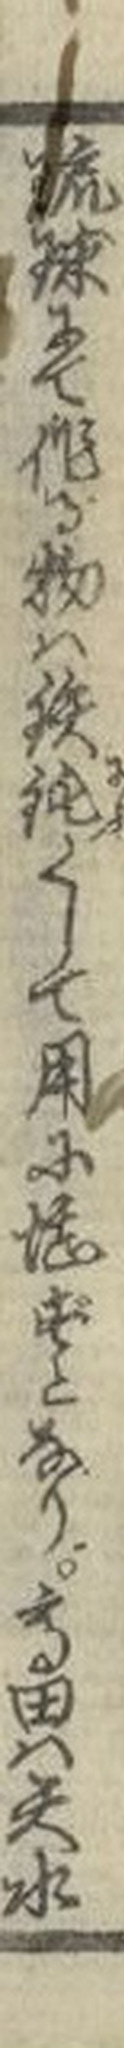琉球にて作る物は鉄鈍くして用に堪ずとなり。高田は天水
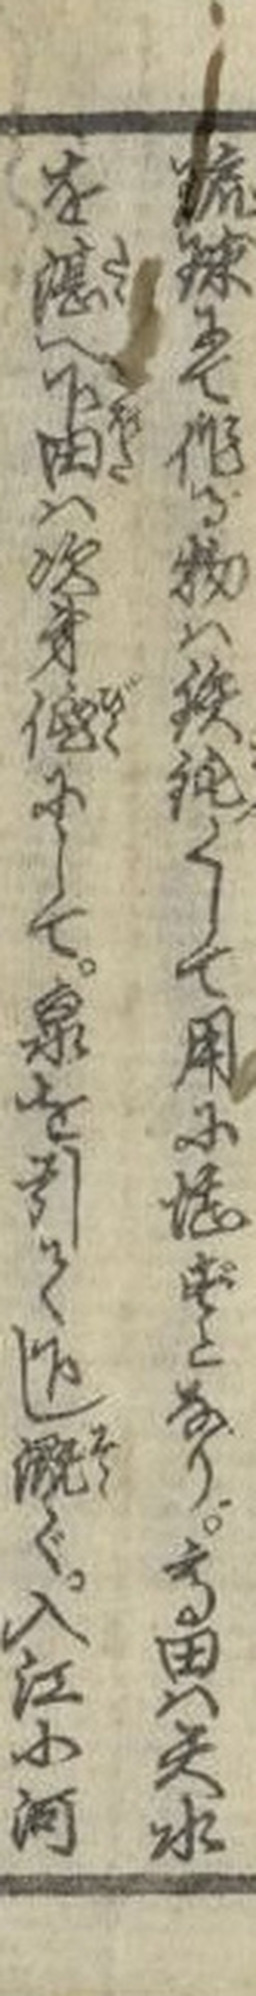を湛へ下田は次第低にして。泉を引て下し漑ぐ。入江に河
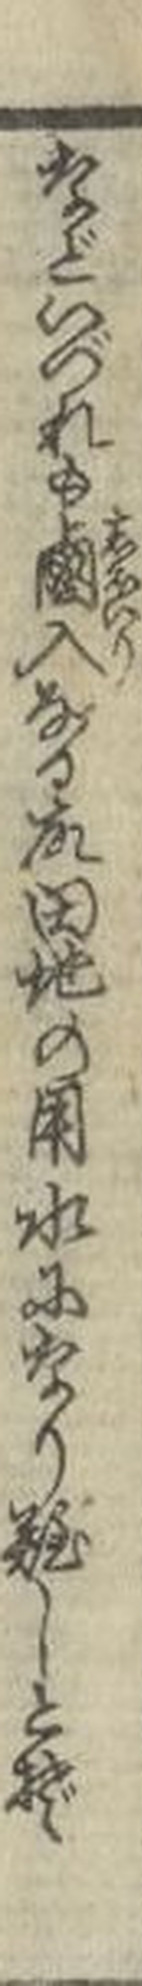などいづれも鹵入なる故田地の用水になり難しとぞ
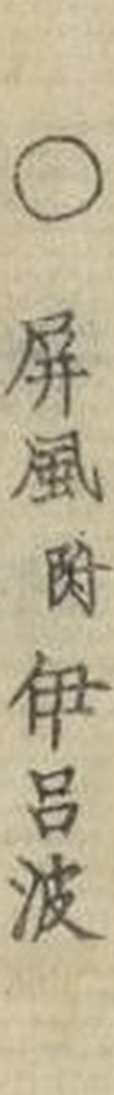○屏風附伊呂波
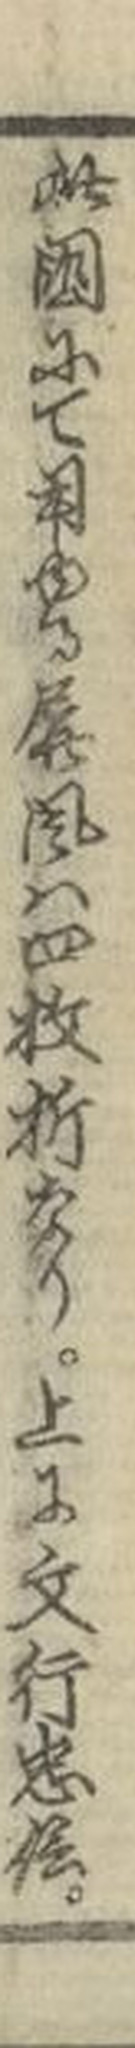此国にて用ゆる屏風は四枚折なり。上に文行忠信。
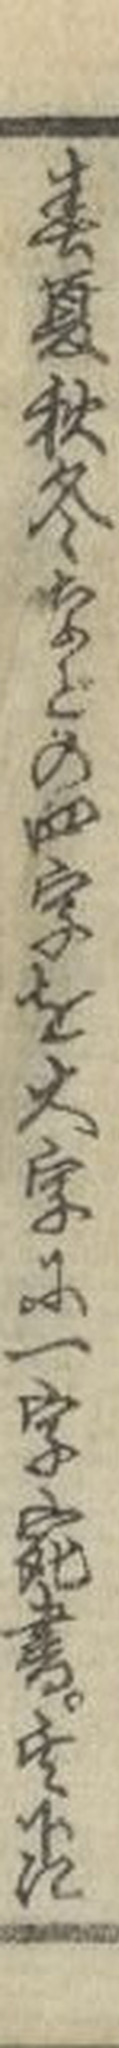春夏秋冬などの四字を大字に一字宛書。其下に
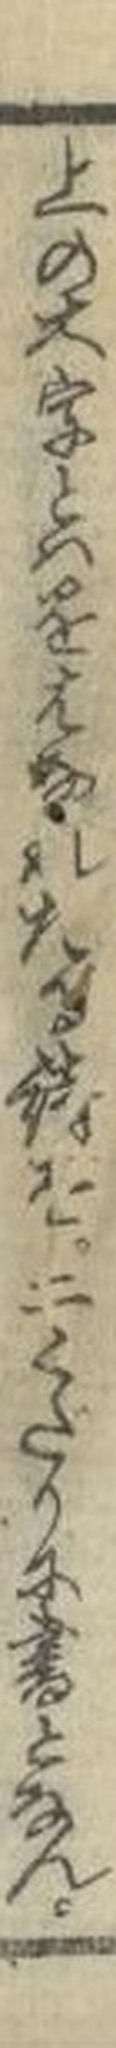上の大字とは懸はなれたる詩を。二くだりに書となん。
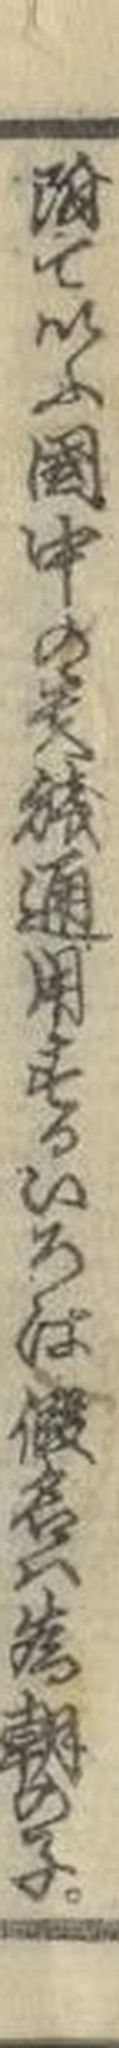附ていふ国中の貴賤通用するいろは仮名は為朝の子。
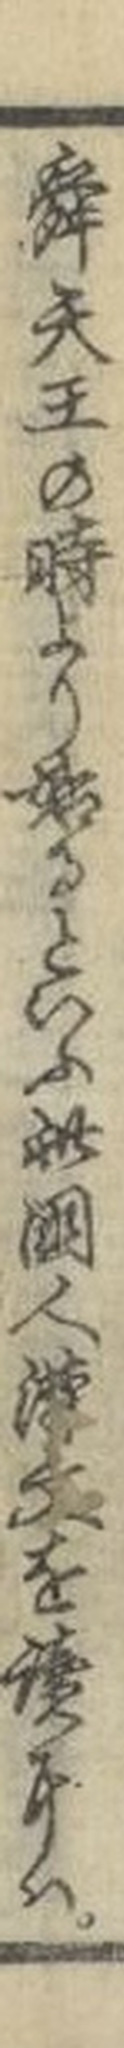舜天王の時より始るといふ此国人漢文を読には。
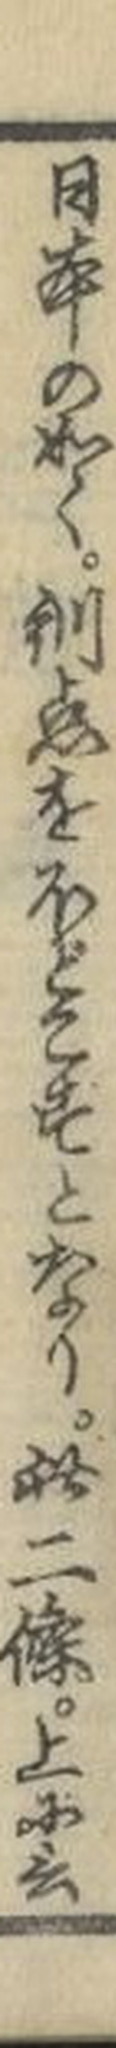日本の如く。訓点をほどこすとなり。此二条。上に言
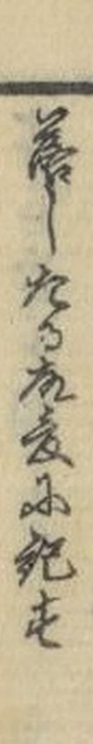落したる故爰に記す
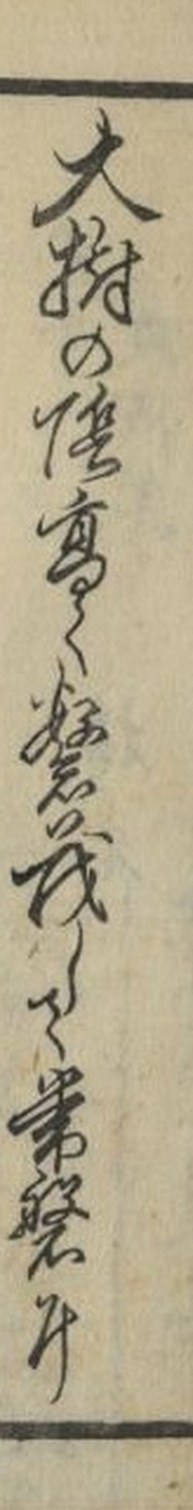大樹の陰高く繁茂して常磐に
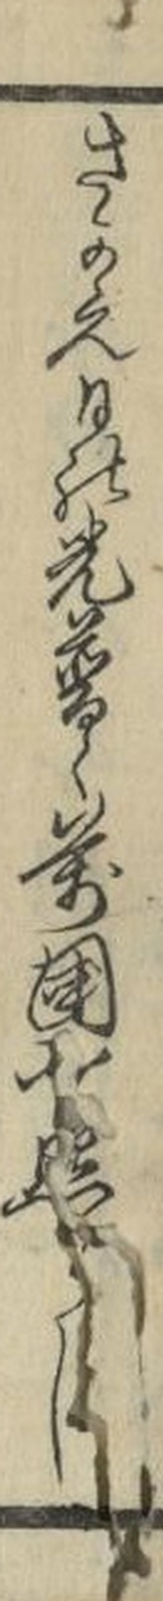さかえ日の光普く万国を照らし
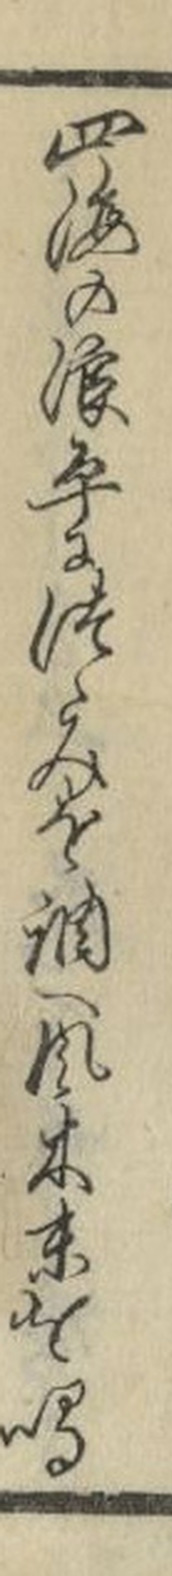四海の浪平につゝみを調へ風木末を鳴
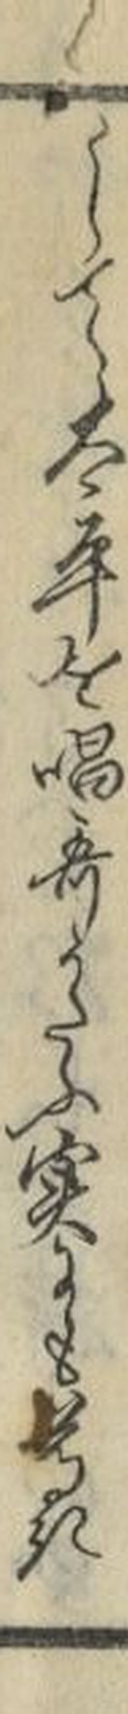して太平を唱哥うたふ実にも尊き
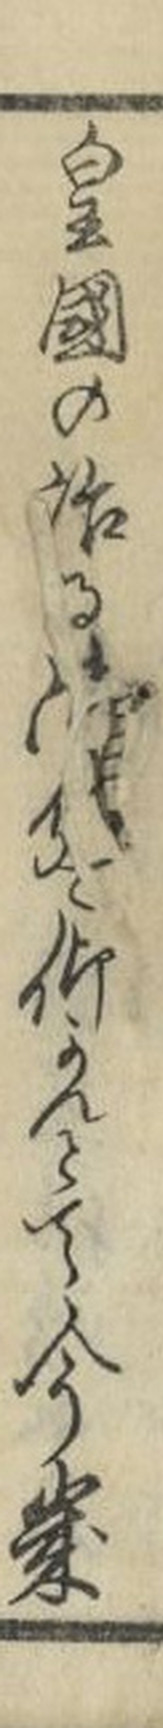皇国の始る御代を仰かんとて今歳
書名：琉球解語
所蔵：University of the Ryukyus Library
